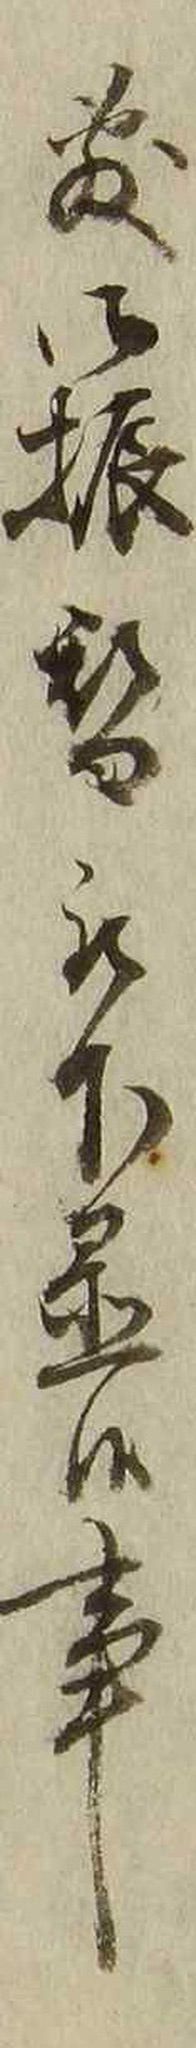敷御振替被下置候事
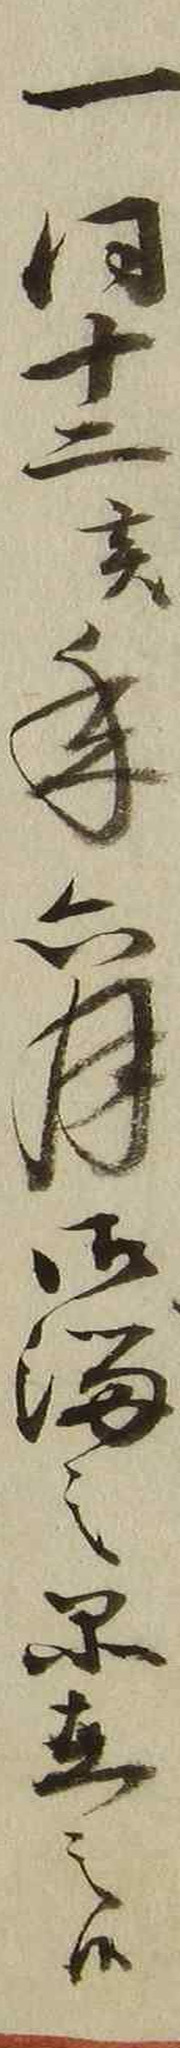一同十二亥年六月御溜之品在之候
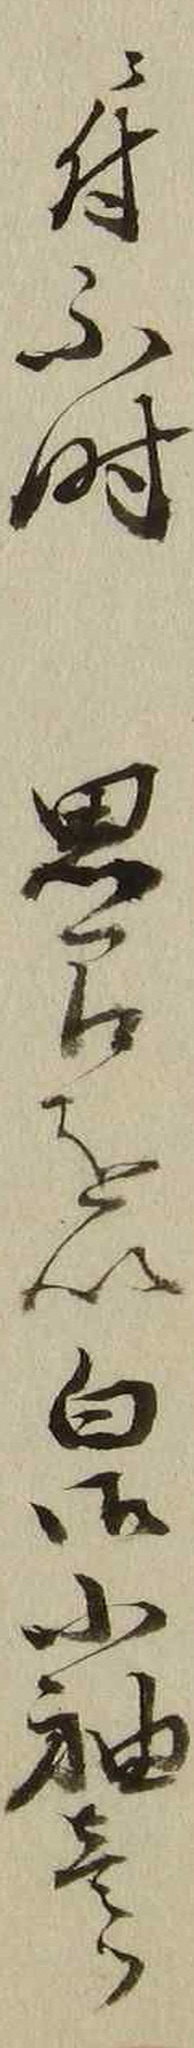ニ付不時思召を以白御小袖壱ツ
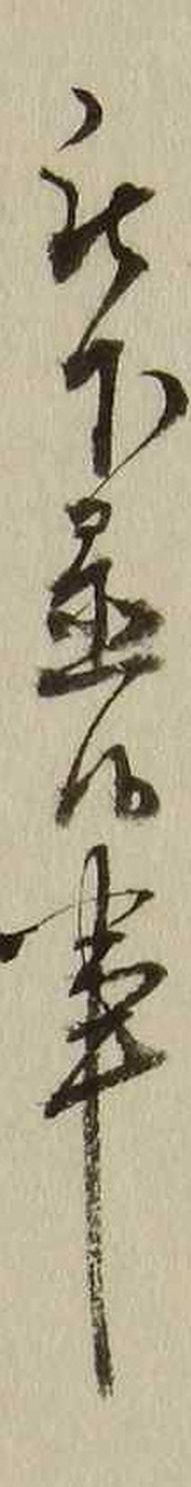被下置候事
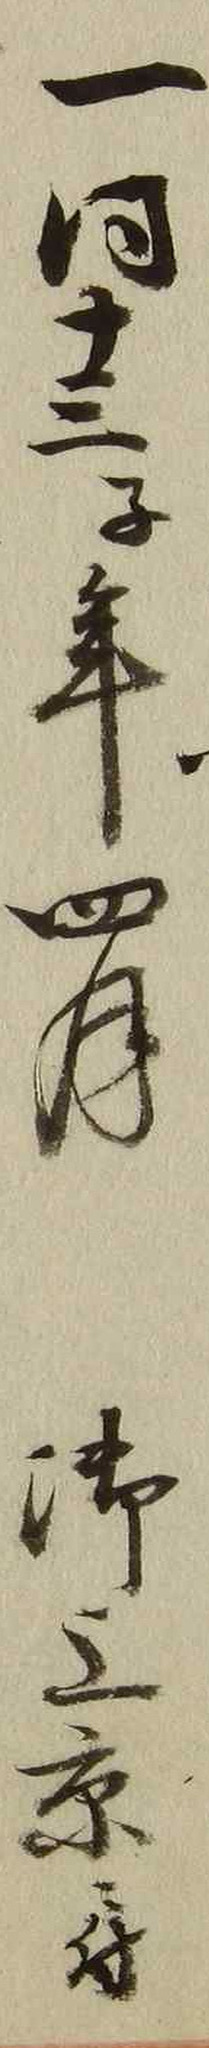一同十三子年四月御上京ニ付
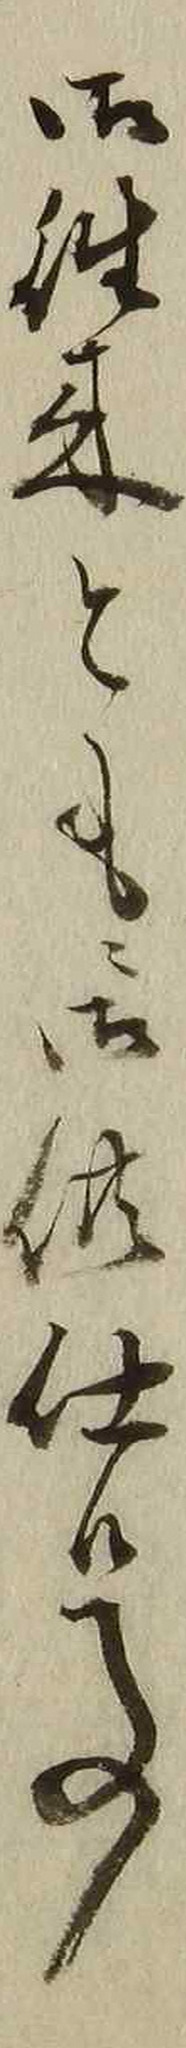御往来ともニ御供仕候事
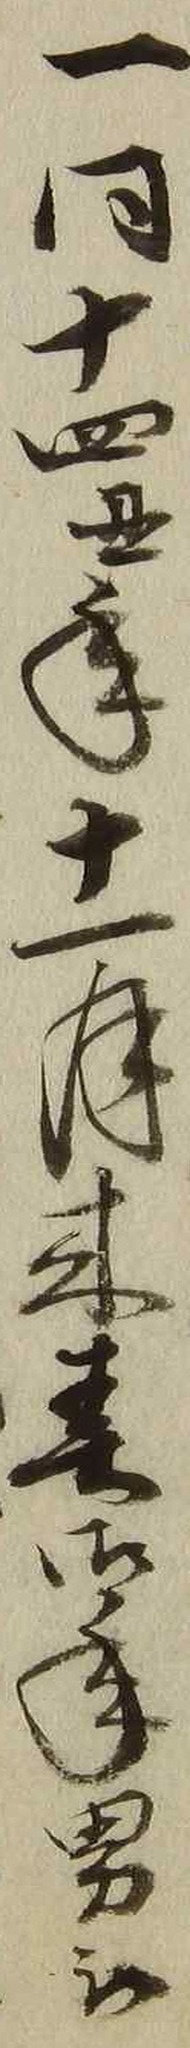一同十四丑年十一月来春御年男被
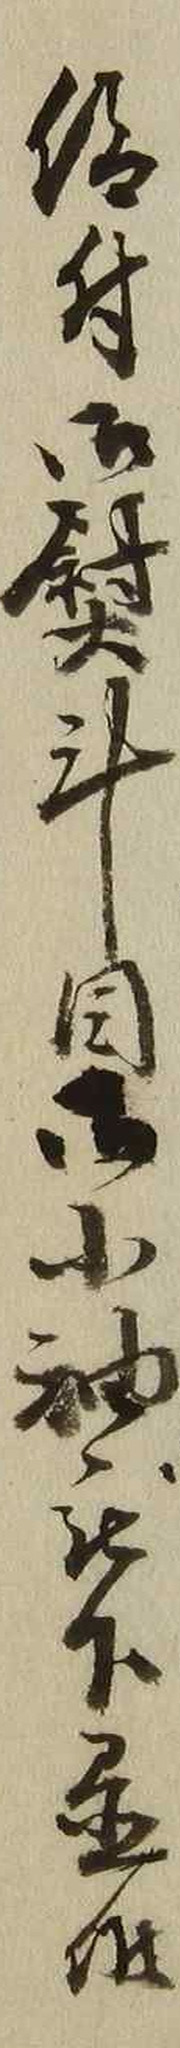仰付御熨斗目小袖被下置候
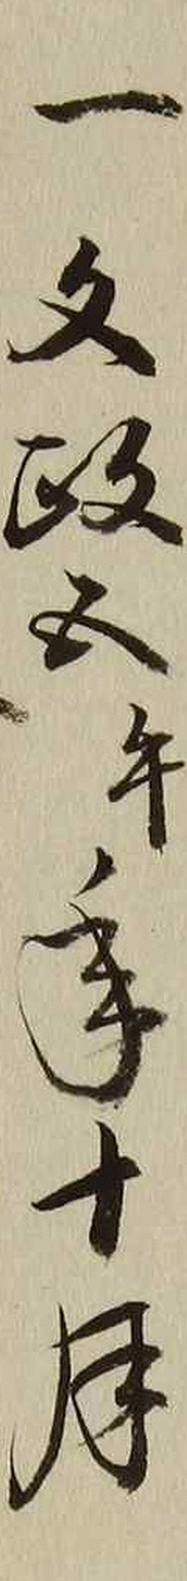一文政五午年十月
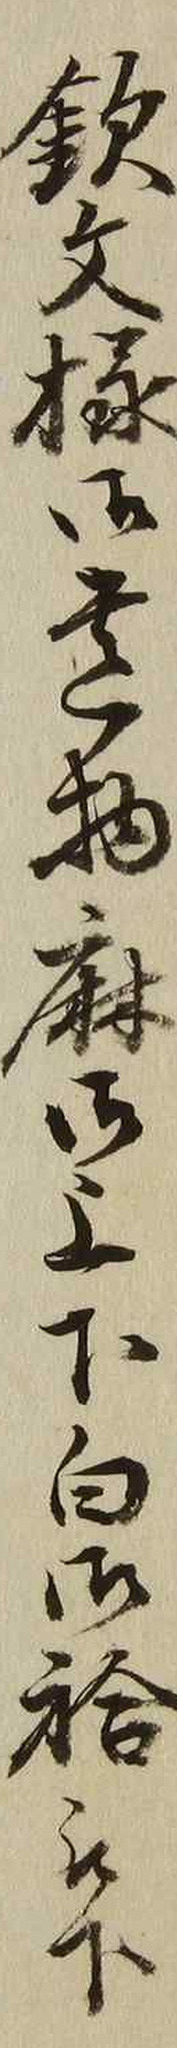欽文様御遺物麻御上下白御袷被下
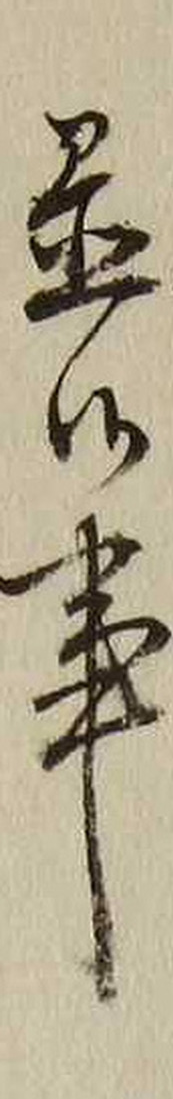置候事
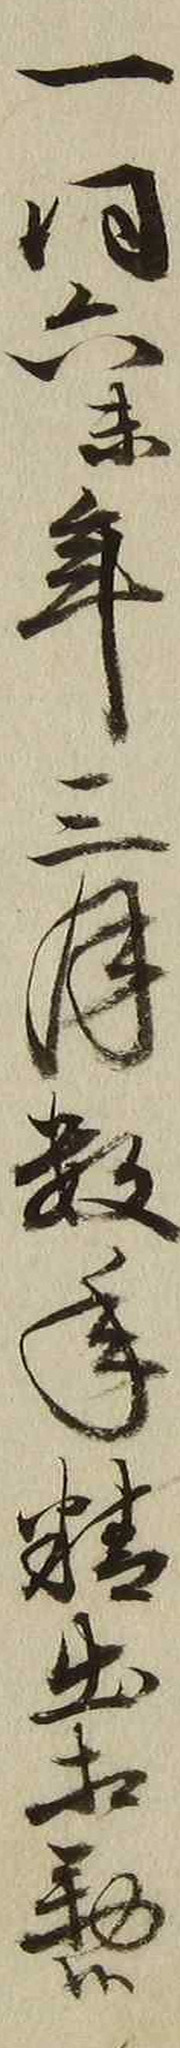一同六未年三月数年精出相勤候
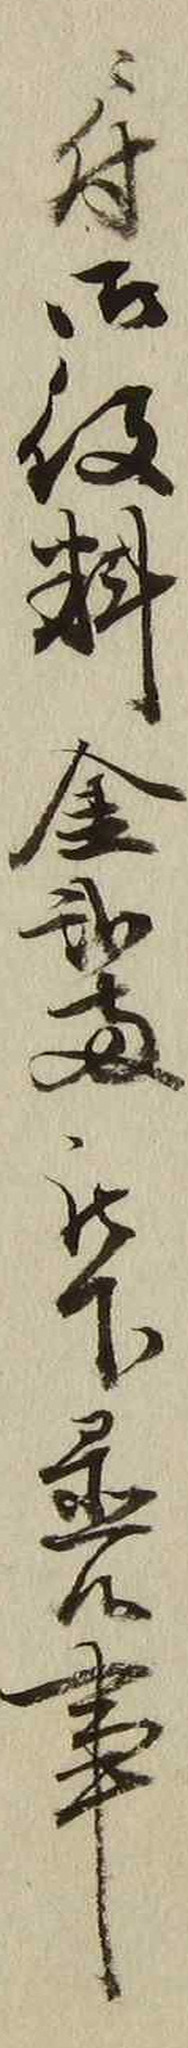ニ付御役料金弐両被下置候事
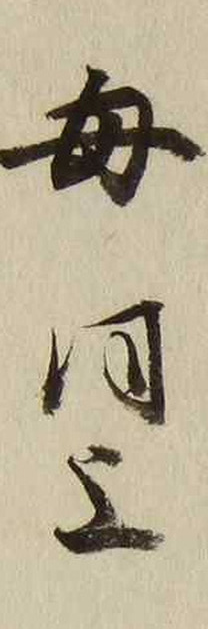母同上

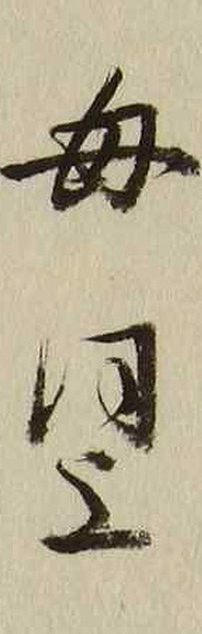母同上
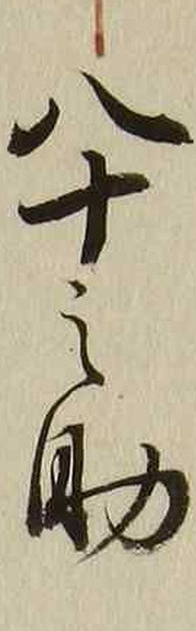八十之助
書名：諸士系譜　巻之36　は之部4
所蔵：会津若松市立会津図書館
